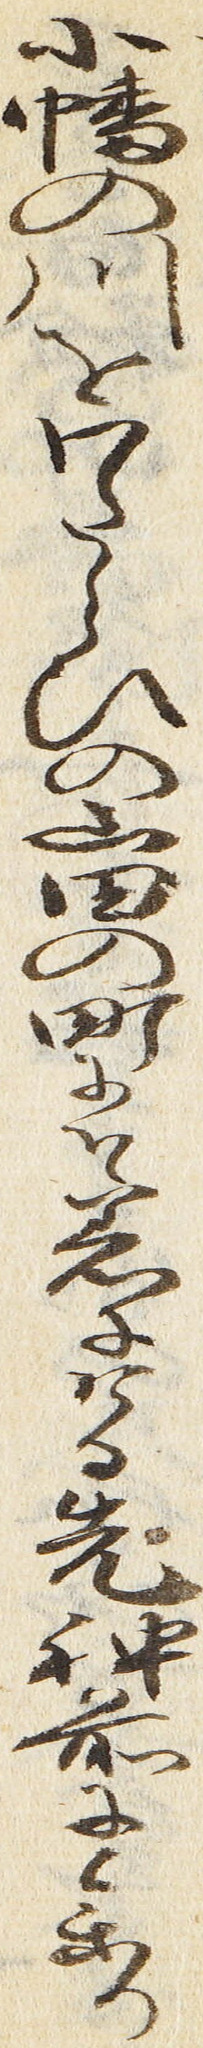小幡の川をわたらひの山田の町にそ着にける先神前に参り
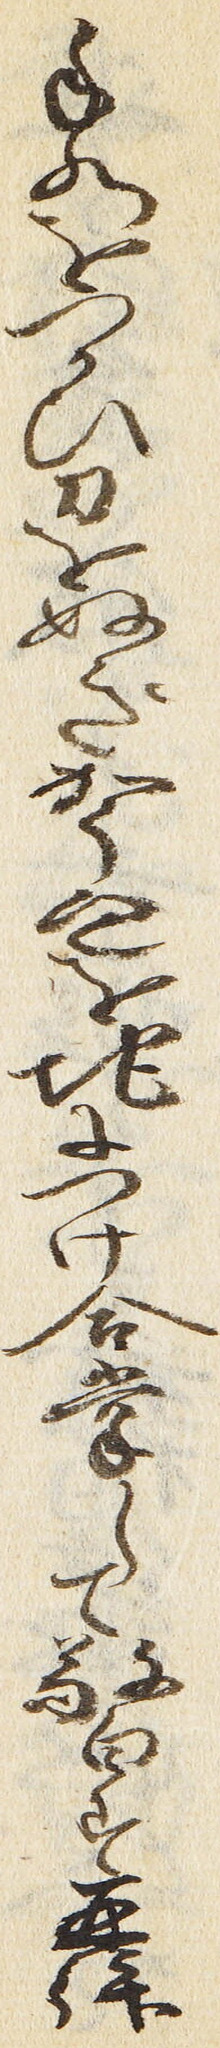手水をつかひ刀をぬぎかうへを地につけ合掌して敬白す再拝
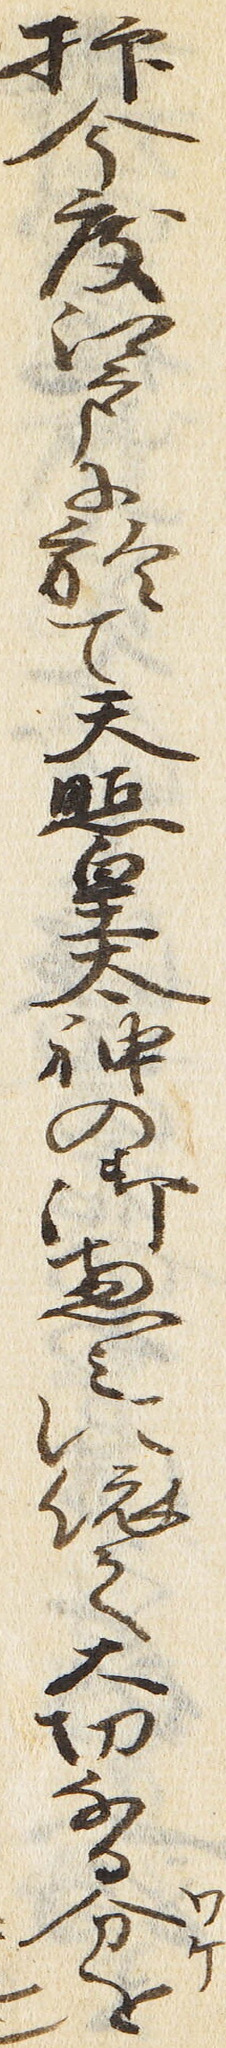抑今度江戸に於て天照皇太神の御恵みに依て大切なる分を
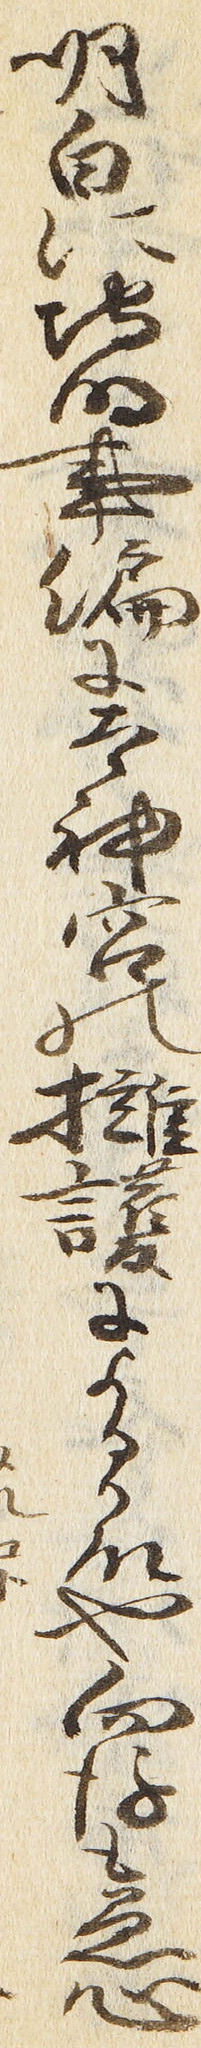明白に埒明事偏に太神宮の擁護によるか故也向後も愚心
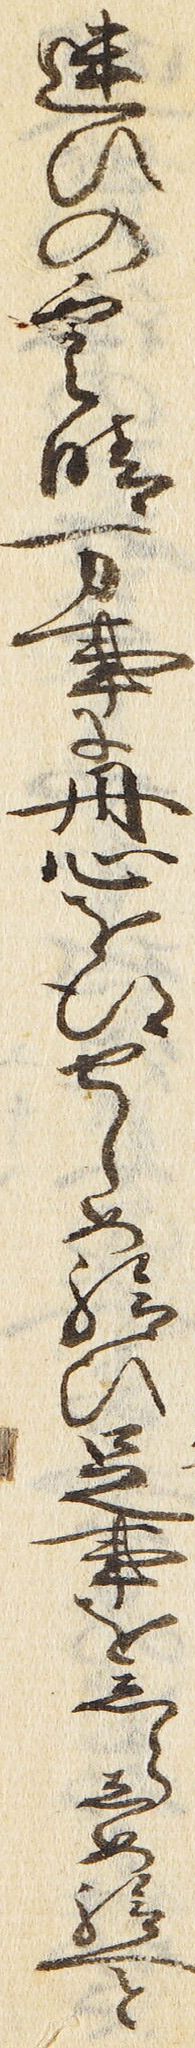迷ひの雲晴万事に丹心を得せしめ給ひ足事をしらしめ給へと
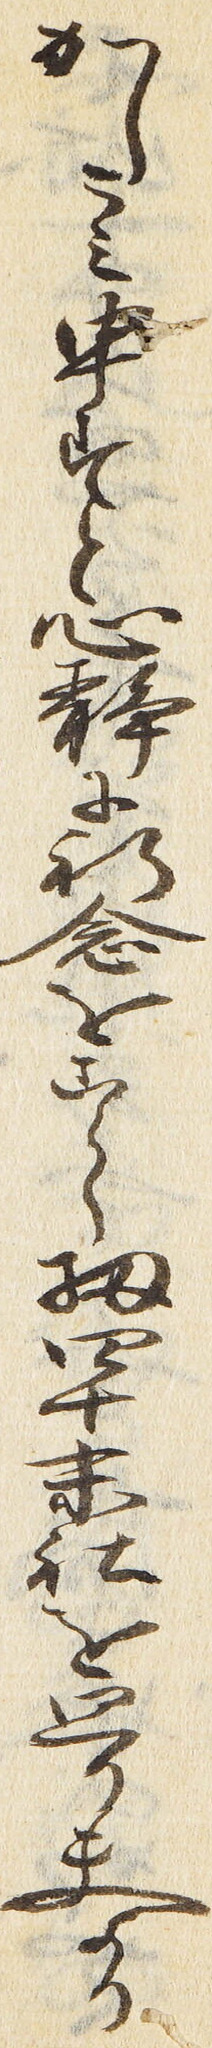かしこみ申すと心静に祈念をこらし扨四十末社を廻り夫より
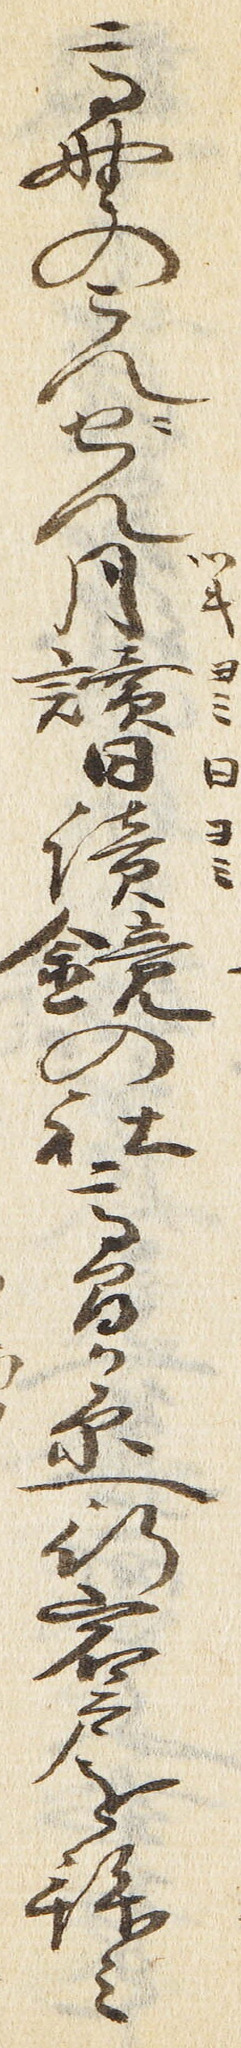高野のこんぜん月読日読鏡の社高間か原へ行岩戸を拝み
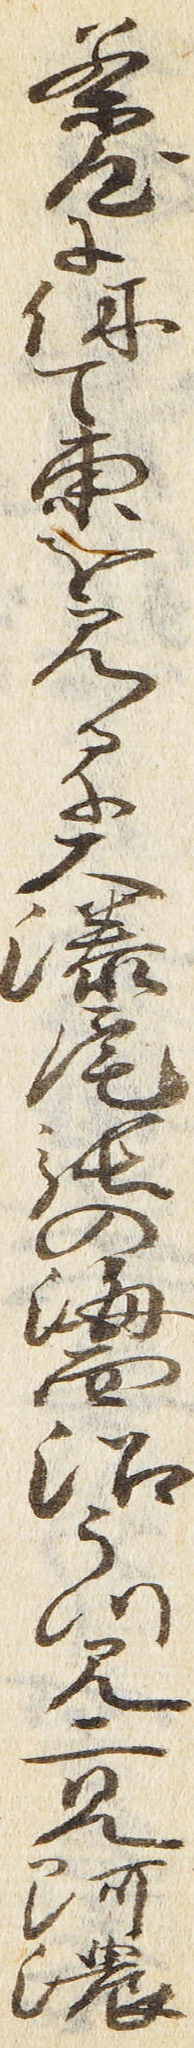茶屋に休て東を見るに大湊尾張の海面沼うつ見二見阿濃
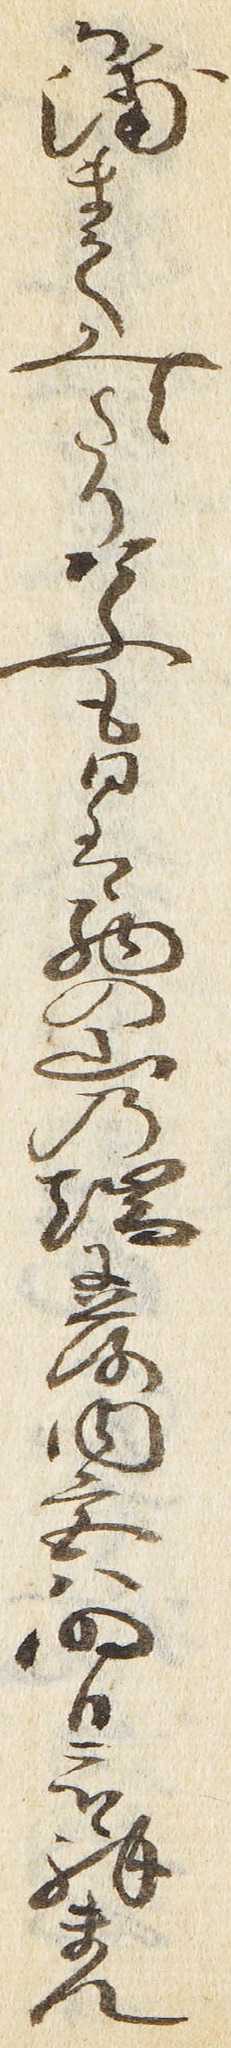か浦まてみえたりけふも日は西の山の端に落内宮は明日にそ拝まん
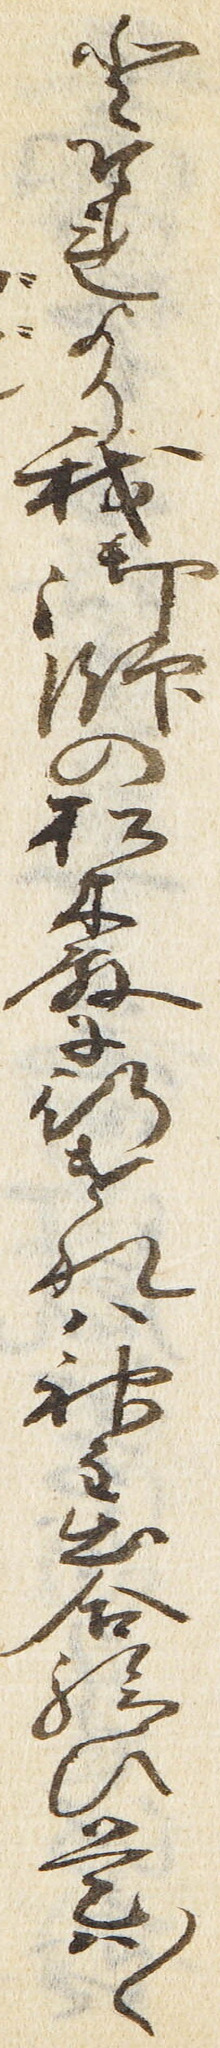とそれより我御師の松木殿に行けれは神主出合給ひ是は〳〵
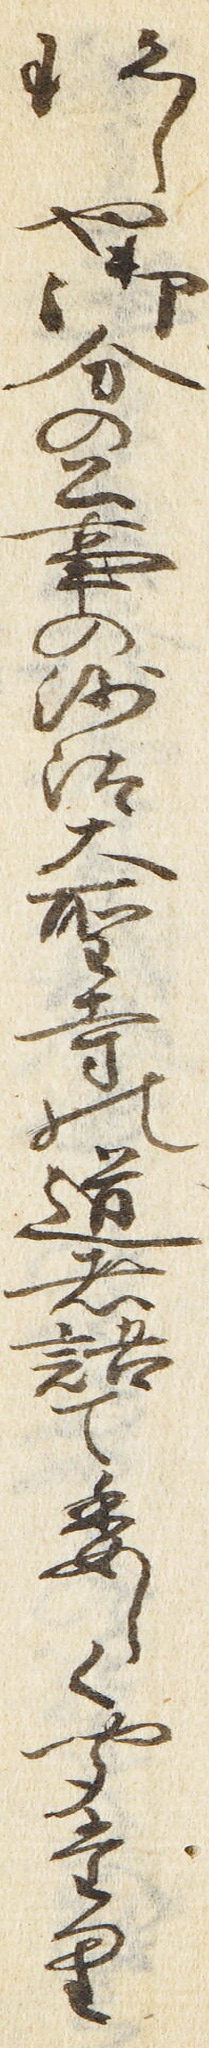珎しや御分の公事の沙汰大聖寺の道者語て委しく聞たり
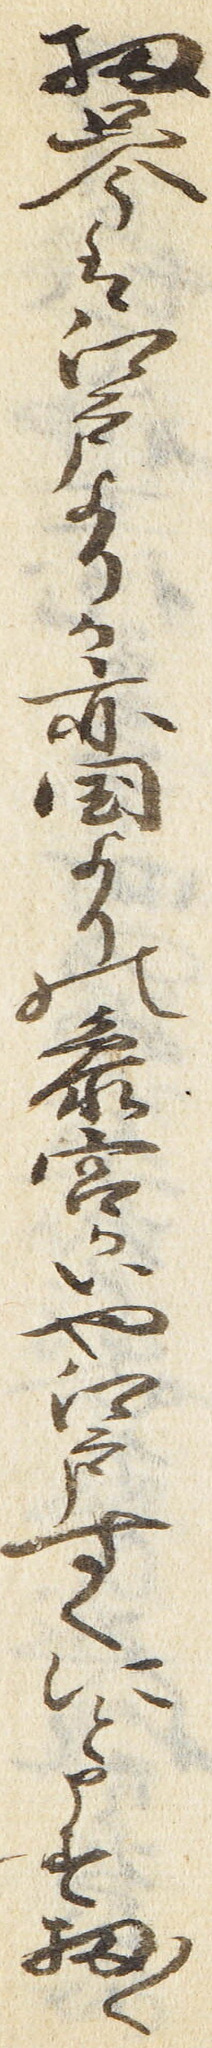扨只今は江戸よりか亦国よりの参宮かいや江戸すくにと申す扨〳〵
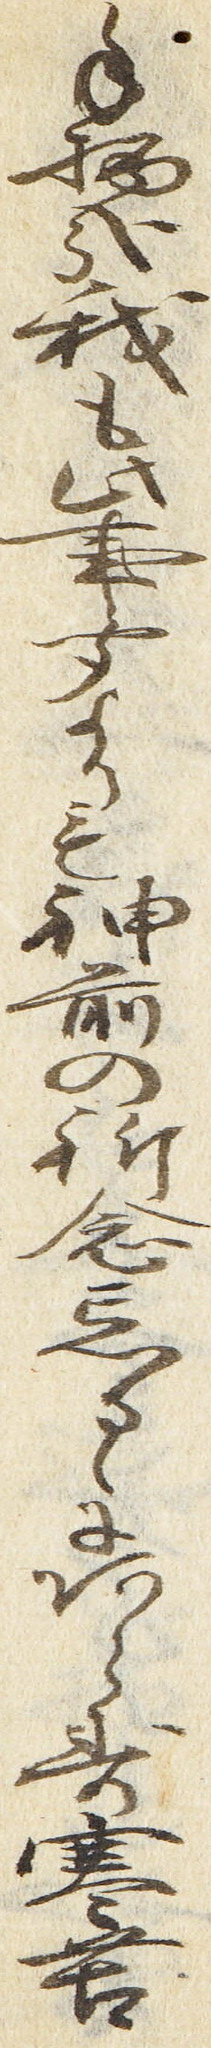手柄哉我も此事聞よりも神前の祈念忘るゝにあらす寒苦
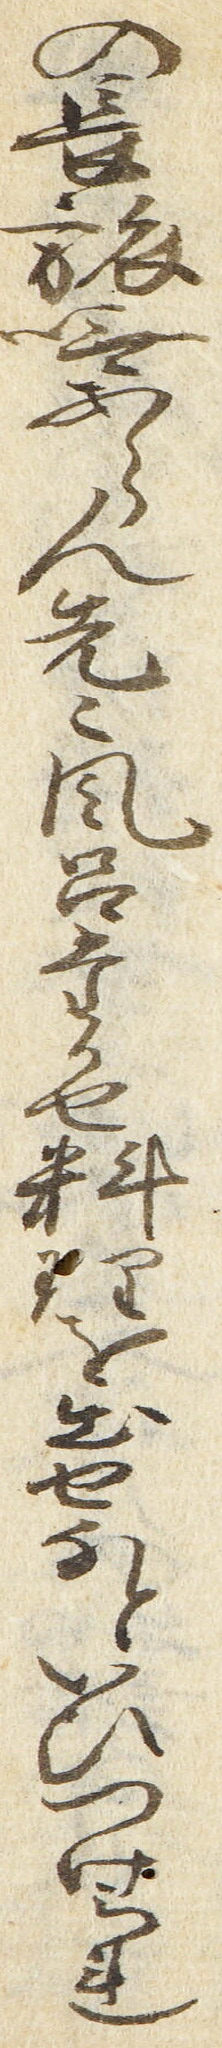の長旅嘸あらん先々風呂たかせ料理を出せなといひつけられ

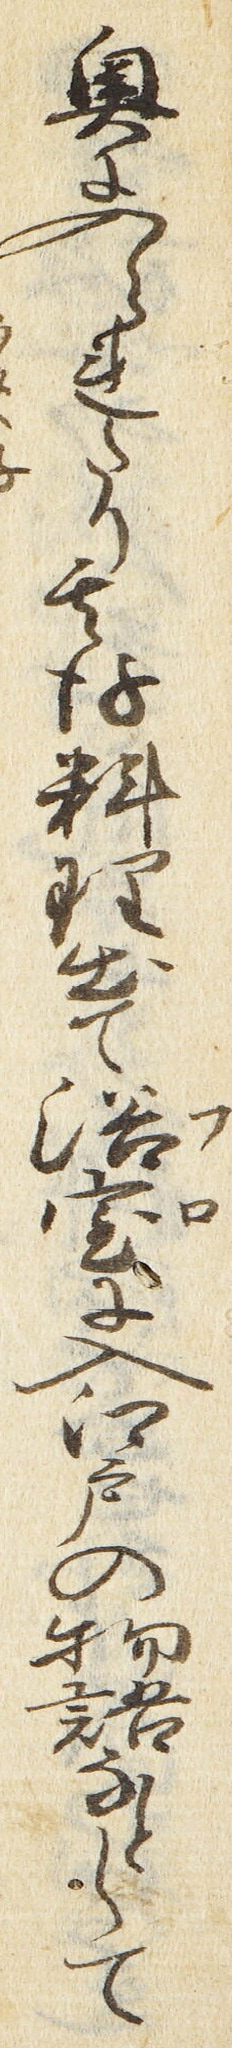奥に入られたり其後料理出て浴室に入江戸の物語なとして
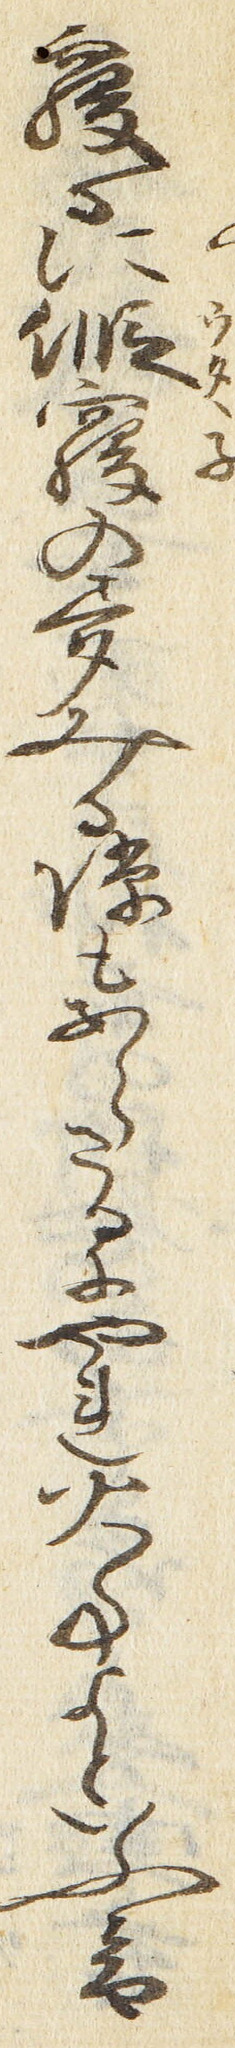寝るに假寝の夢みる隙もあらさるにやれ火事よといふ音
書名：海陸世話日記
